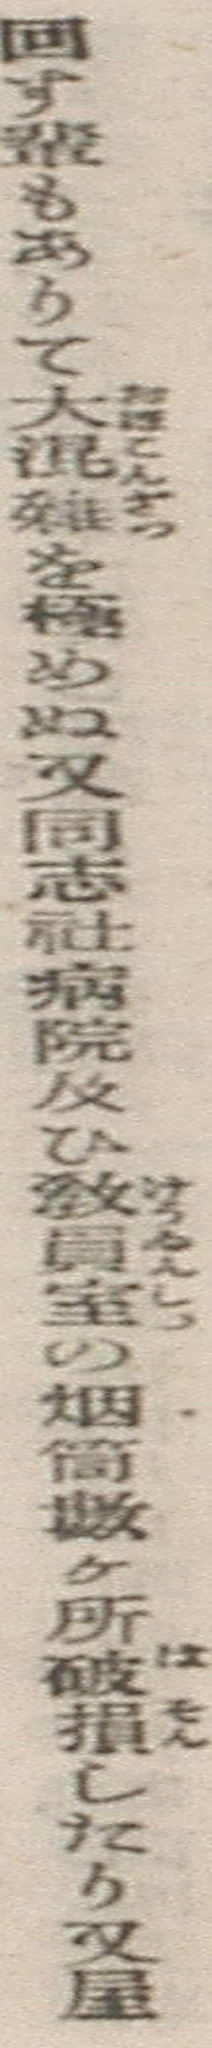回す輩もありて大混雑を極めぬ又同志社病院及び教員室の烟筒数ヶ所破損はそんしたり又屋
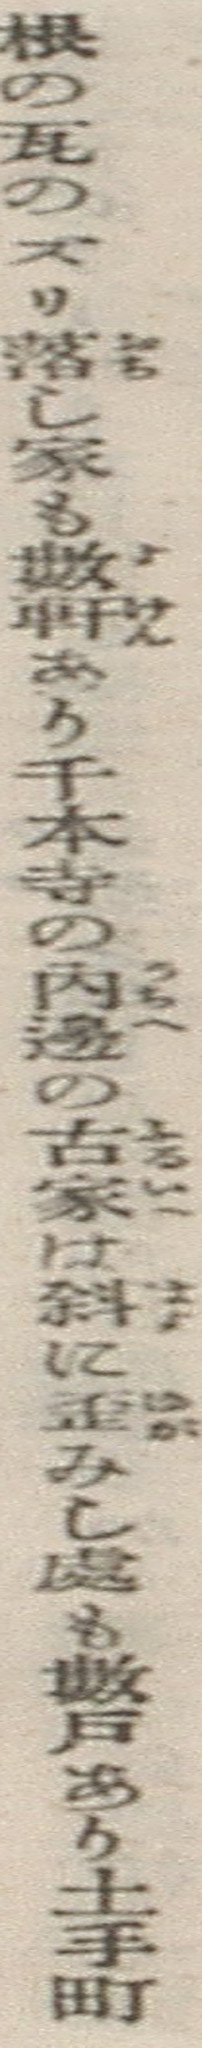根の瓦のズリ落し家も数軒あり千本寺の内邊の古家は斜に歪みし處も数戸あり土手町
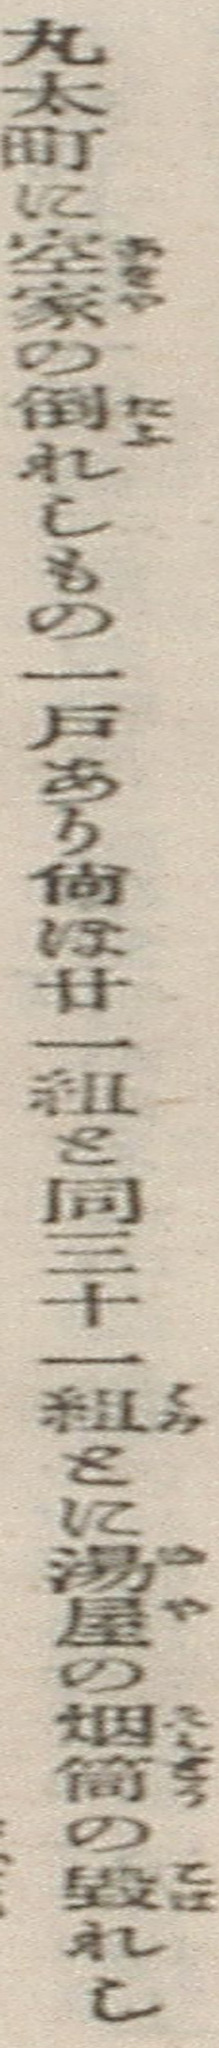丸太町に空家の倒れしもの一戸あり尚ほ廿一組と同三十一組とに湯屋の烟筒の毀れし
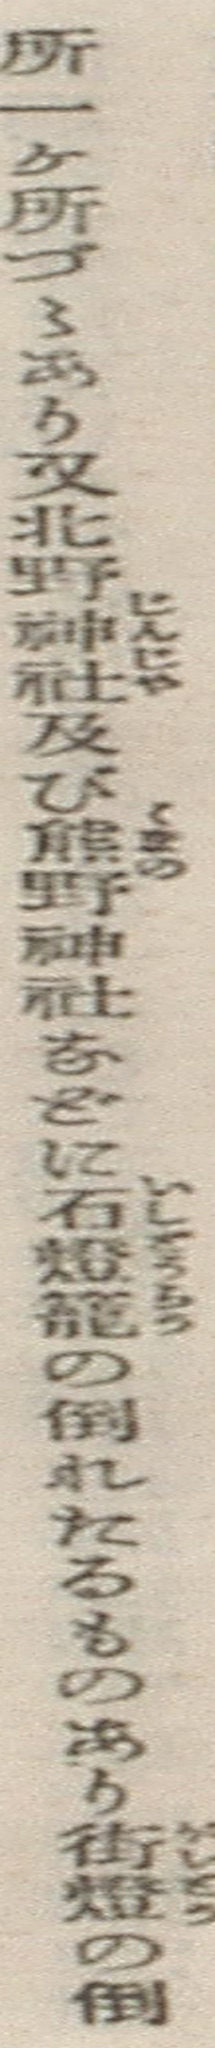所一ヶ所づゝあり又北野神社及び熊野神社などに石燈籠の倒れたるもあり街燈の倒
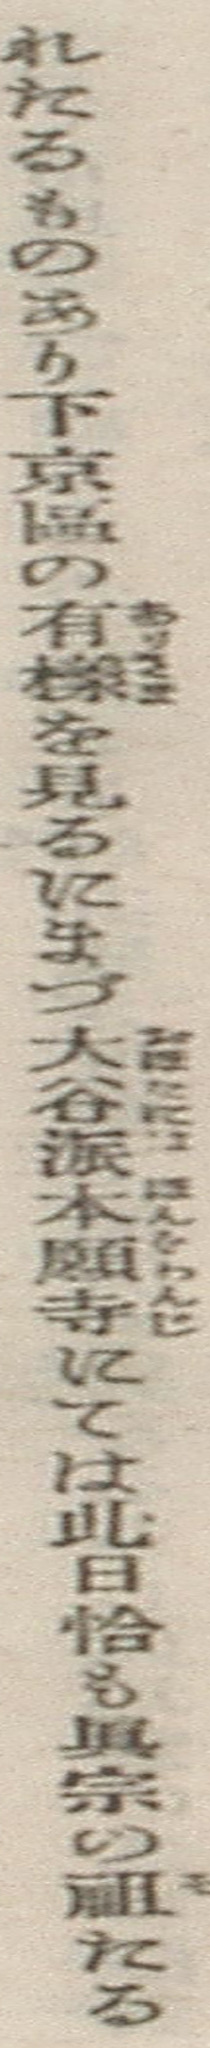れたるもあり下亰區の有様を見るにまづ大谷派本願寺にては此日恰も真宗の祖たる
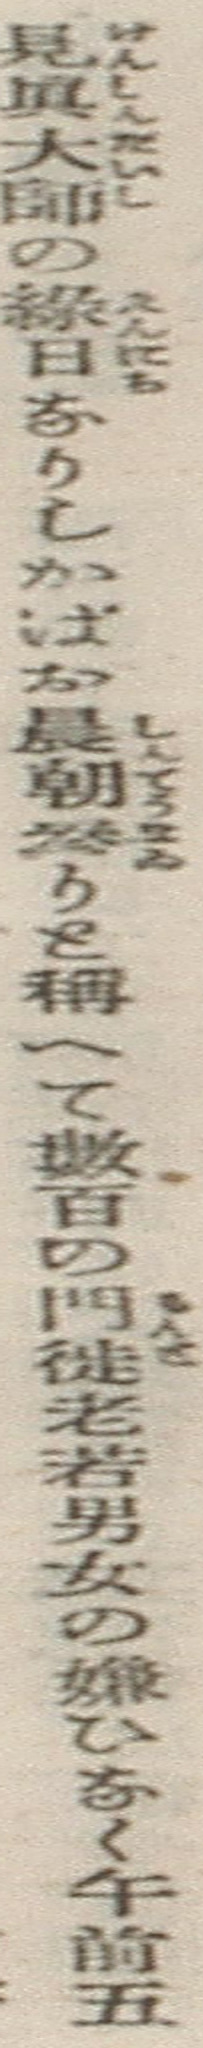見真大師の縁日なりしかばお晨朝参りと称へて数百の門徒老若男女の嫌ひなく午前五
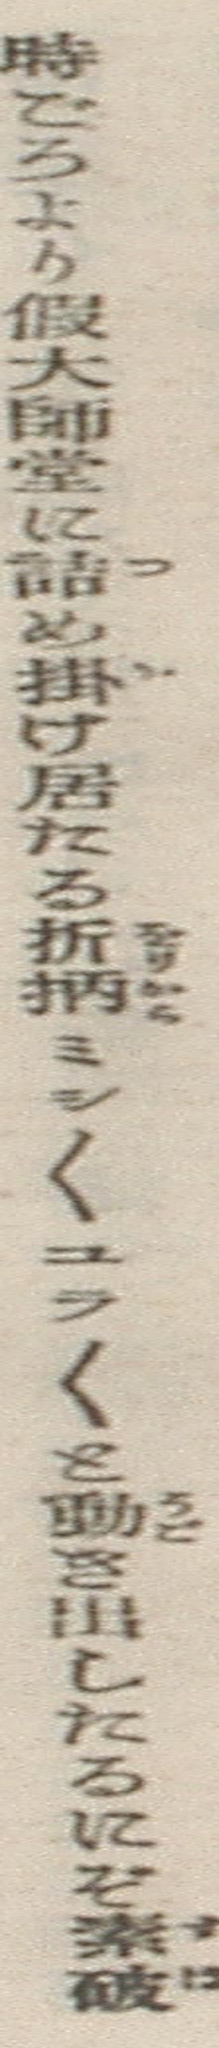時ごろより假大師堂に詰め掛け居たる折柄ミㇱ〳〵ユラ〳〵と動き出したるにぞ素破
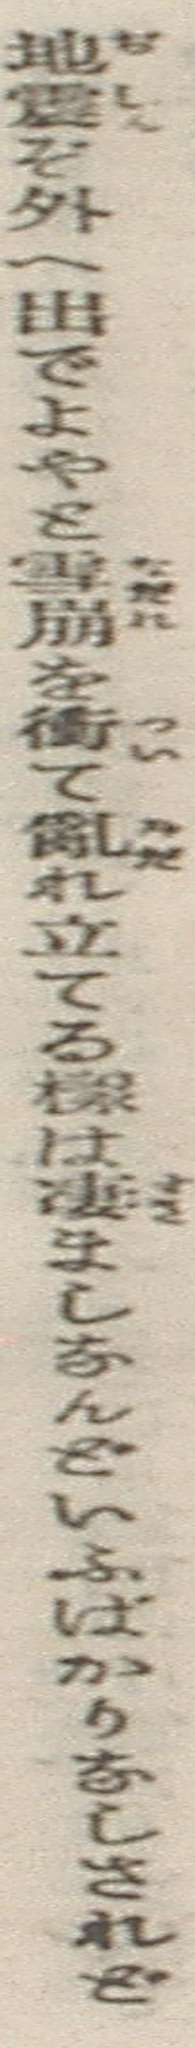地震ぞ外へ出でよやと雪崩を衝て亂れ立てる様は凄ましなんどいふばかりなしされど
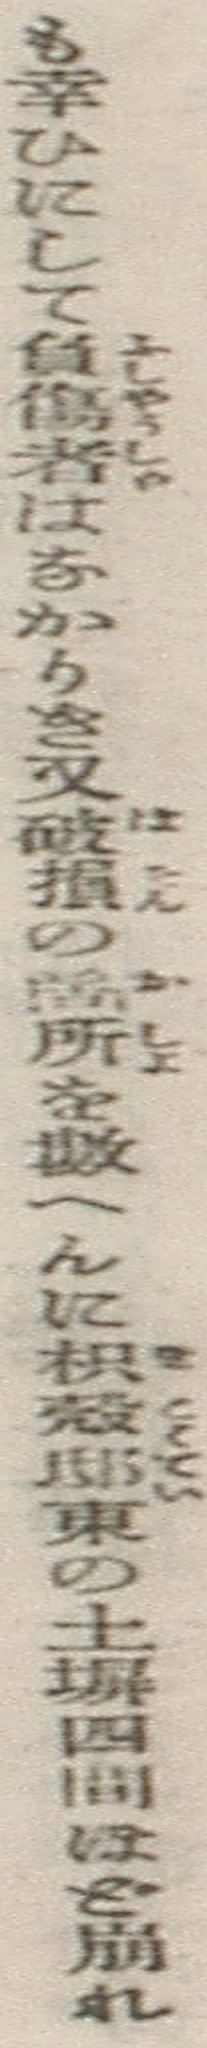も幸ひにして負傷者はなかりき又破損の箇所を数へんに枳穀邸東の土塀四間ほど崩れ
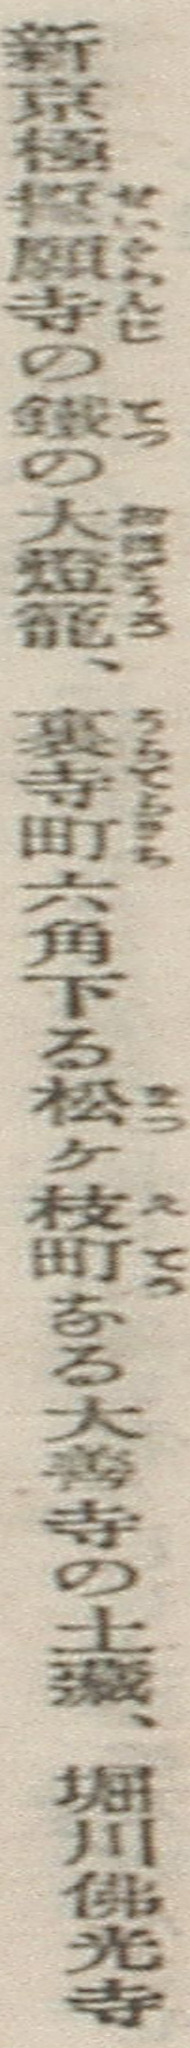新京極誓願寺の鐡の大燈籠、裏寺町六角下松まつヶ枝町なる大善寺の土蔵、堀川仏光寺
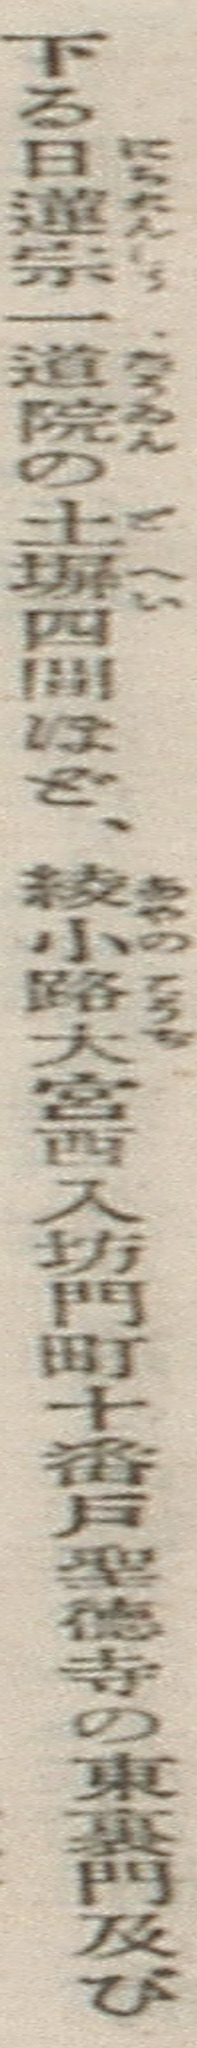下る日蓮宗一道院の土塀四間ほど、綾小路大宮西入坊門町十番戸聖徳寺の東裏門及び
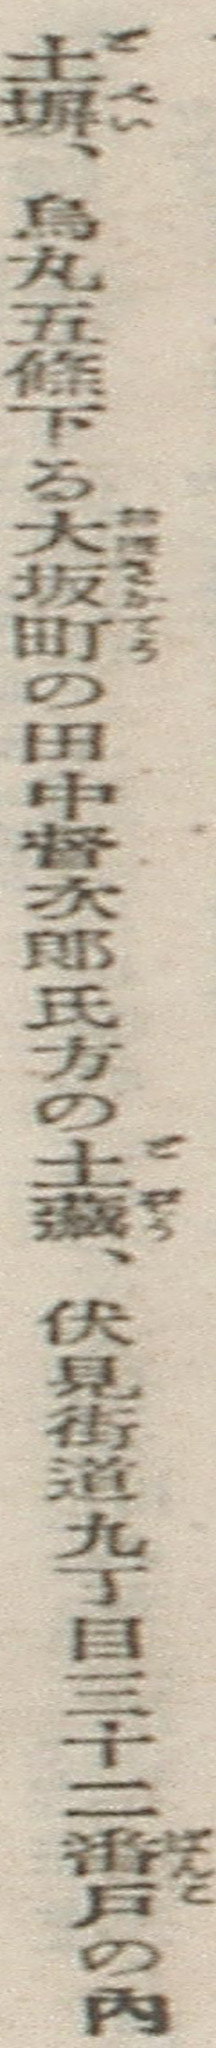土塀、烏丸五條下る大坂町の田中督次郎氏方の土蔵、伏見街道九丁目三十二番戸ばんこの内

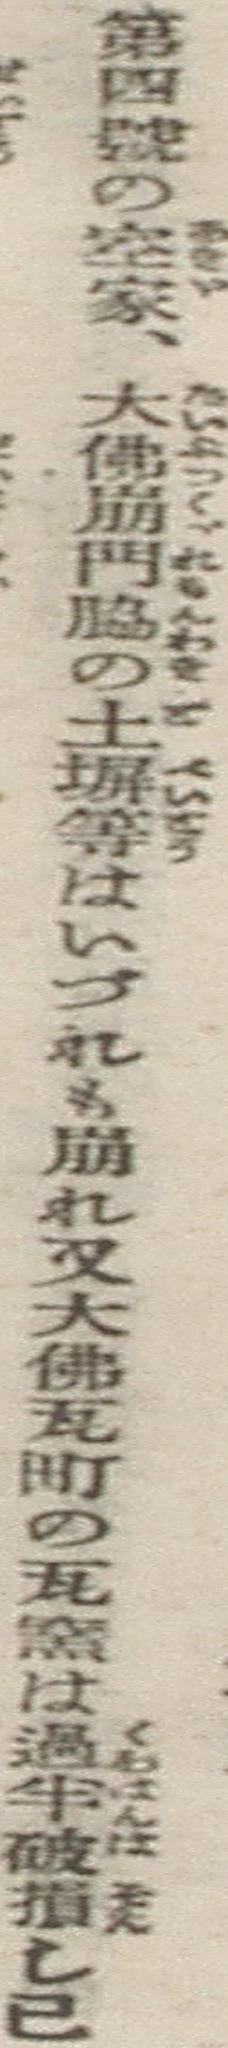第四號の空家、大佛崩門脇の土塀等はいづれも崩れ又大佛瓦町の瓦窯は過半破損し已
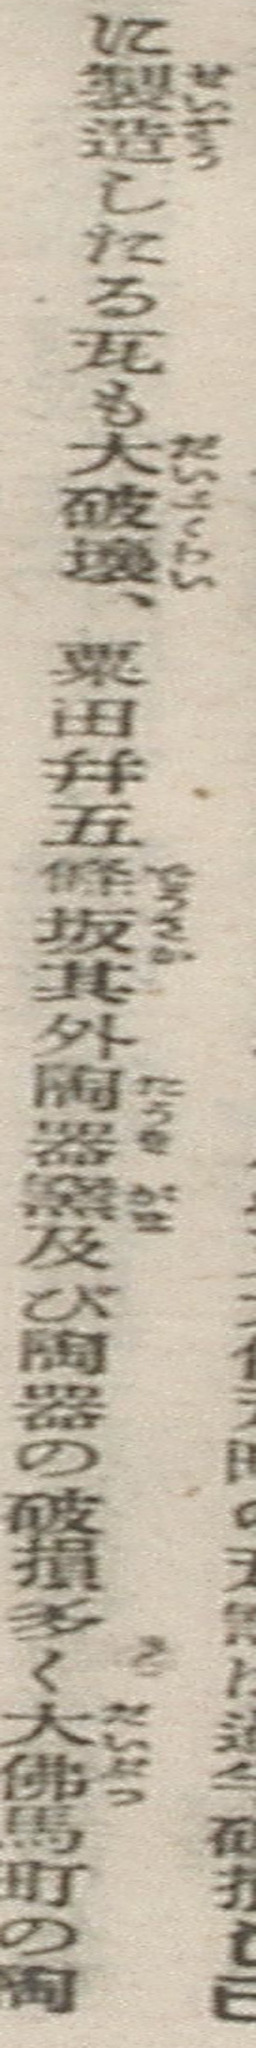に製造したる瓦も大破壊、粟田并五條坂其外陶器窯及び陶器の破損多く大佛馬町の陶
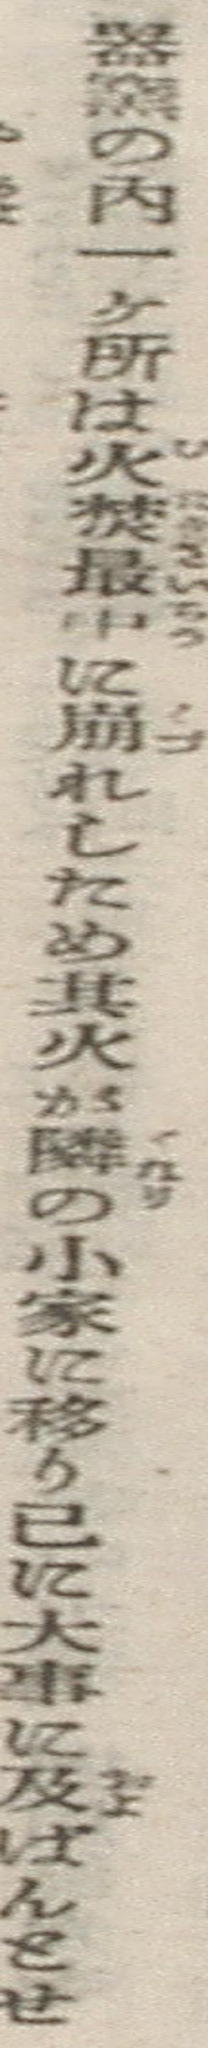器窯の内一ヶ所は火焚最中に崩れしため其火が隣の小家に移り已に大事に及ばんとせ
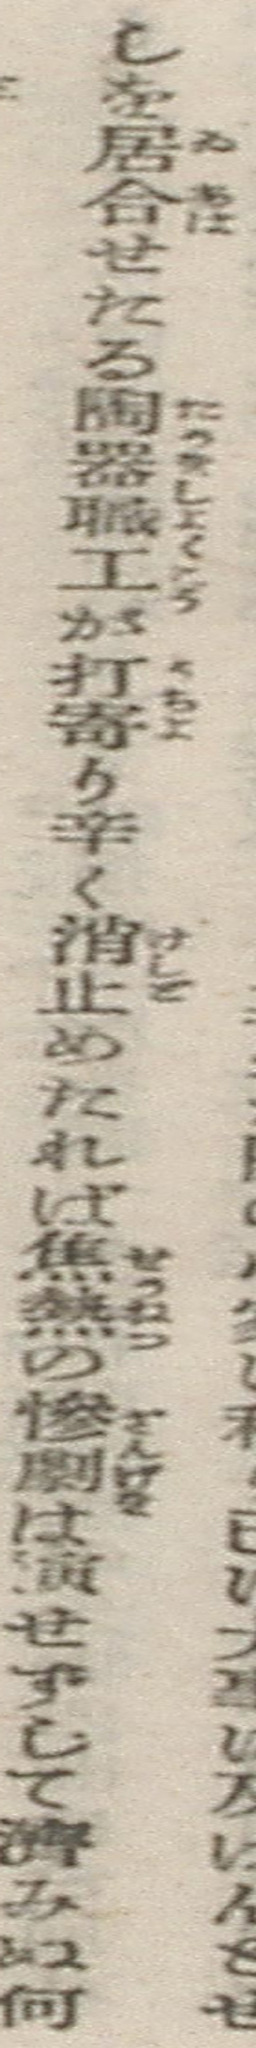しを居合せたる陶器職工が打寄り辛く消止めたれば焦熱の惨劇は演せずして済みぬ何
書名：愛知岐阜福井三県　大地震見聞録（内題）
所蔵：東京大学地震研究所図書室 Earthquake Research Institute Library, The University of Tokyo, JAPAN
